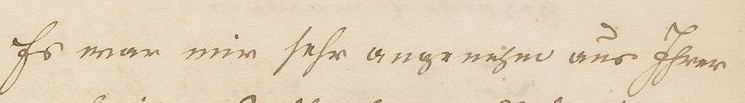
Es war mir sehr angenehm aus Ihrer
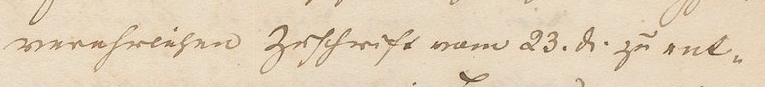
verehrlichen Zuschrift vom 23. d. zu ent-
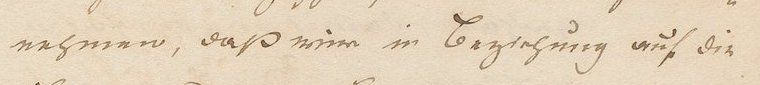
nehmen, daß wir in Beziehung auf die
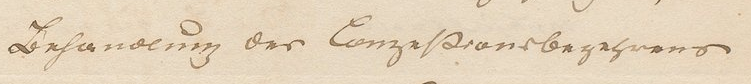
Behandlung des Conzessionsbegehrens
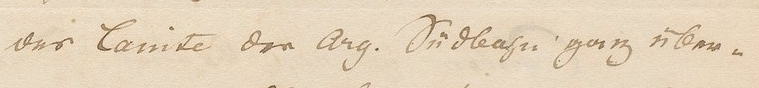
des Comité der Arg. Südbahn ganz über-
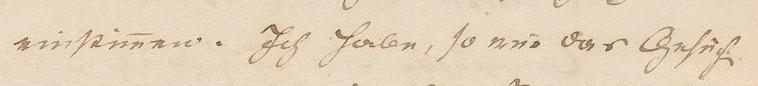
einstimmen. Ich habe, so wie das Gesuch
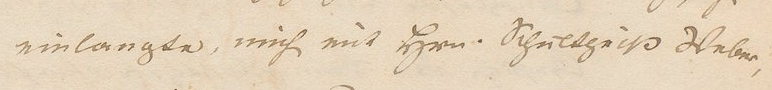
einlangte, mich mit Hrn. Schultheiß Weber,
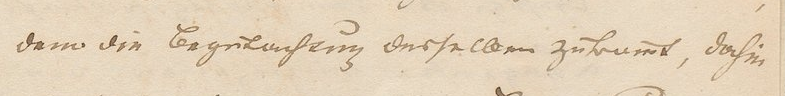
dem die Begutachtung desselben zukommt, dahin
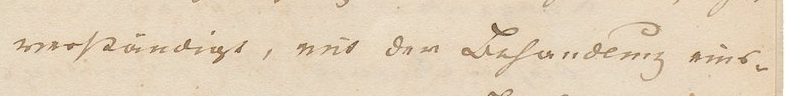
verständigt, mit der Behandlung eins-
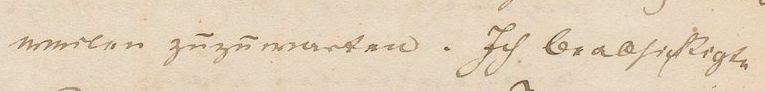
weilen zuzuwarten. Ich beabsichtigte
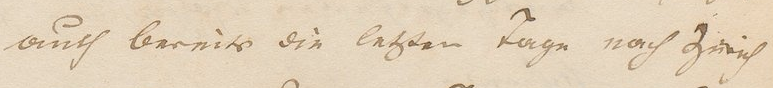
auch bereits die letzten Tage nach Zürich
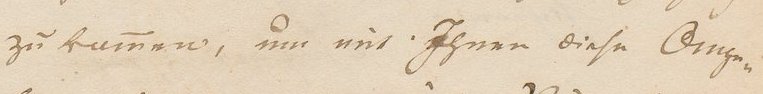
zu kommen, um mit Ihnen diese Ange-
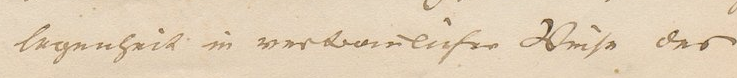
legenheit in vertraulicher Weise des
